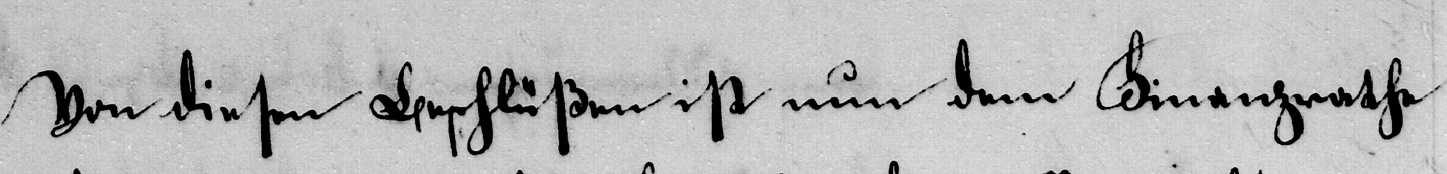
Von diesen Beschlüßen ist nun dem Finanzrathe
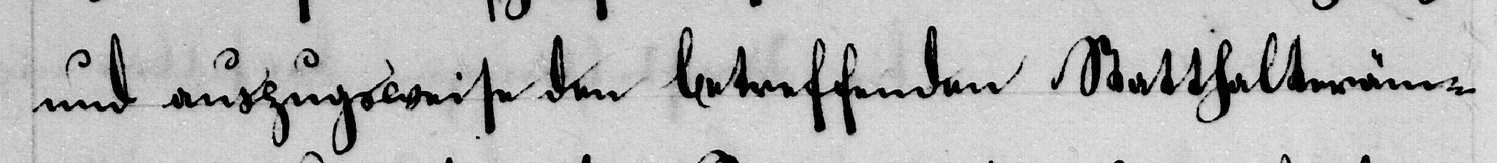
und auszugsweise den betreffenden Statthalteräm¬
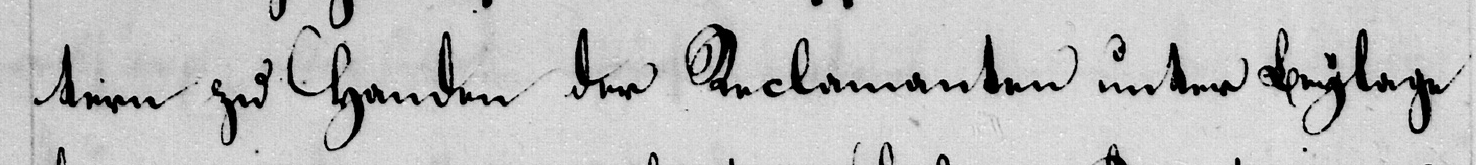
tern zu Handen der Reclamanten unter Beylage
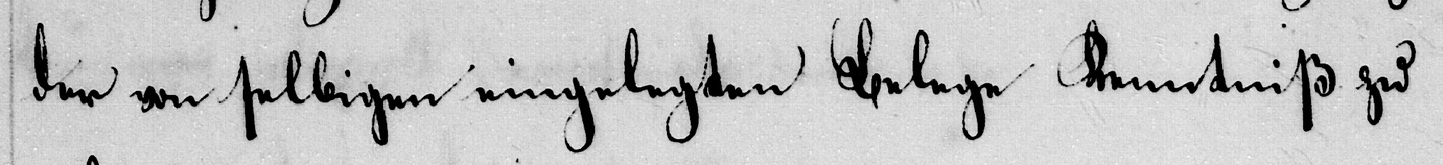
der von selbigen eingelegten Belege Kenntniß zu
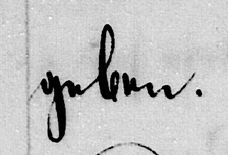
geben.
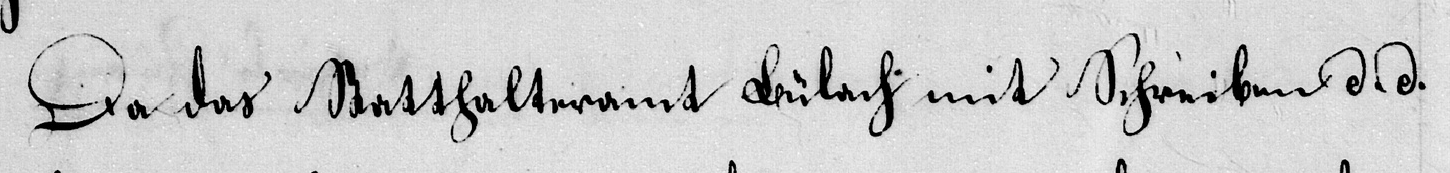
Da das Statthalteramt Bülach mit Schreiben d. d.
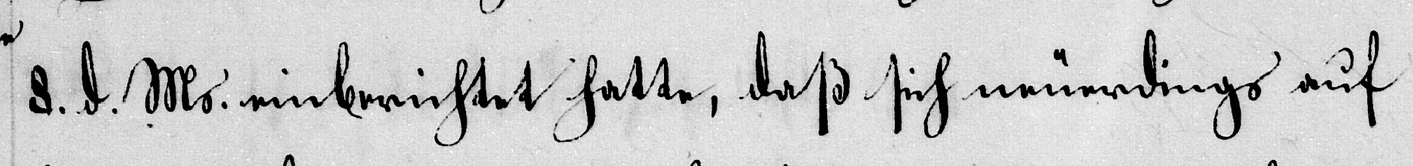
8. d. Ms. einberichtet hatte, daß sich neuerdings auf
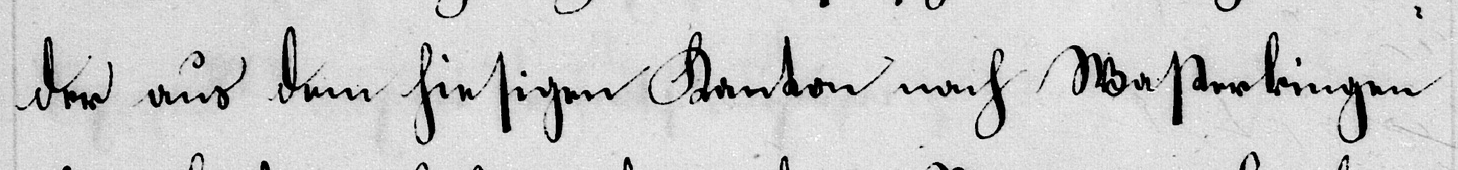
der aus dem hiesigen Kanton nach Wasterkingen
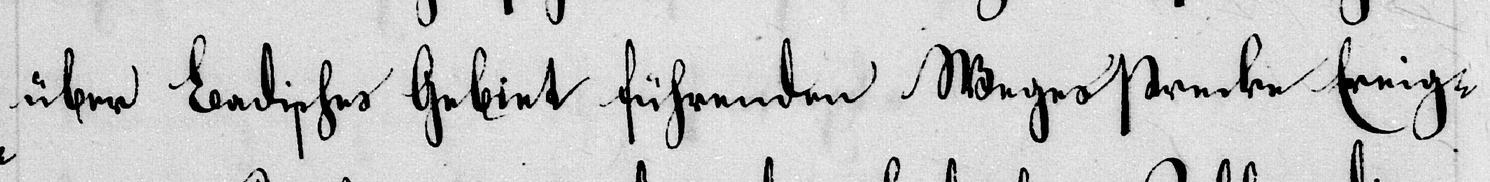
über Badisches Gebiet führenden Wegesstrecke Ereig¬
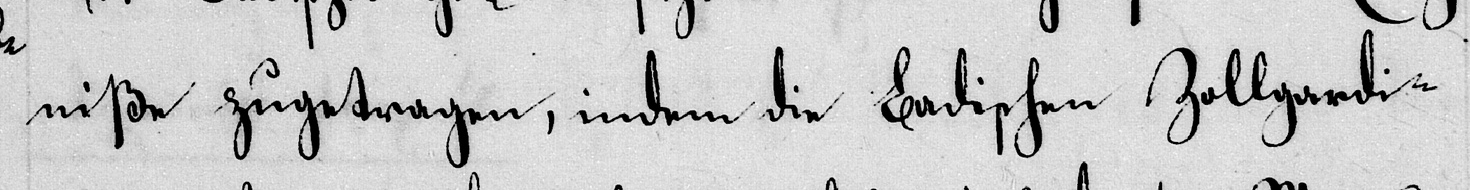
niße zugetragen, indem die Badischen Zollgardi¬
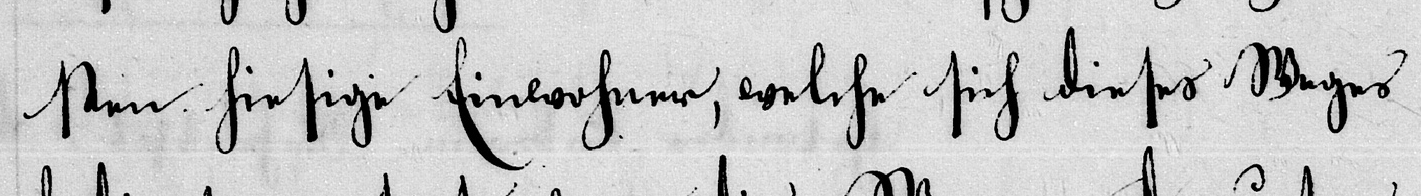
sten hiesige Einwohner, welche sich dieses Weges
